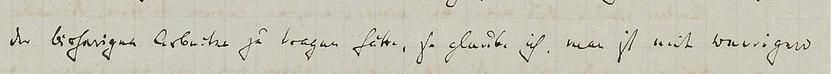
der bisherigen Arbeiten zu tragen hätte, so glaube ich, man ist mit wenigen
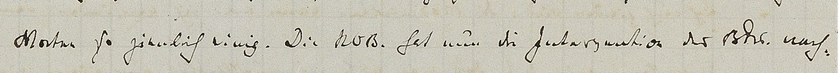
Worten so ziemlich einig. Die NOB. hat nun die Intervention des Bdes. nach-
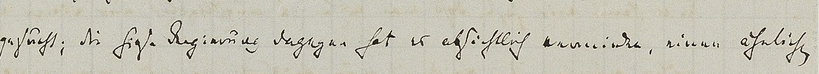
gesucht; die hies. Regierung dagegen hat es absichtlich vermieden, einen ähnlichen
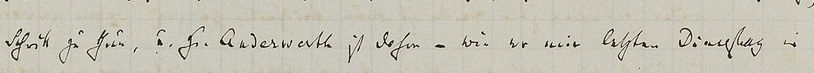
Schritt zu thun, u. Hr. Anderwerth ist daher – wie er mir letzten Dienstag in
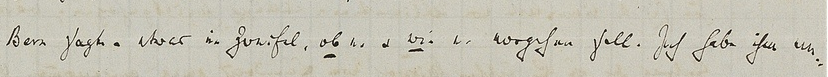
Bern sagte – etwas im Zweifel, ob er & wie er vorgehen soll. Ich habe ihm em-
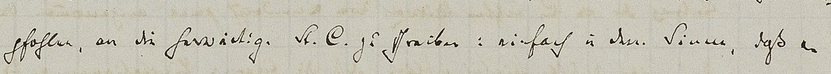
pfohlen, an die herwärtige St.C. zu schreiben: einfach in dem Sinne, daß er
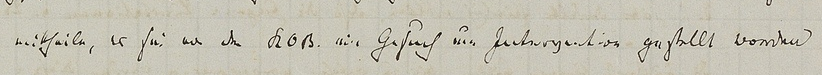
mittheile, es sei von der NOB. ein Gesuch um Intervention gestellt worden
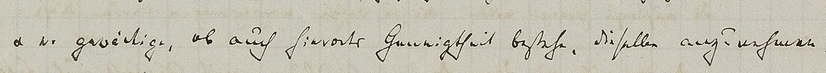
& er gewärtige, ob auch hierorts Geneigtheit bestehe, dieselbe anzuehmen.
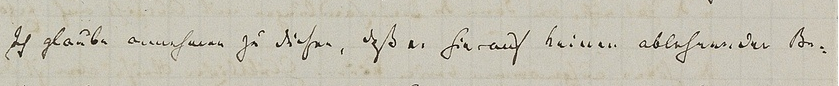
Ich glaube annehmen zu dürfen, daß er hierauf keinen ablehnenden Be-
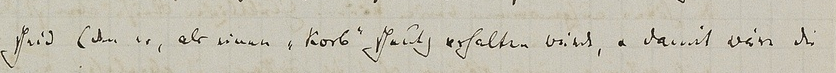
scheid (den er, als einen «Korb» scheut) erhalten würde, & damit wäre die
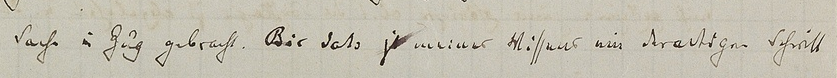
Sache in Zug gebracht. Bis dato ist meines Wissens ein derartiger Schritt
